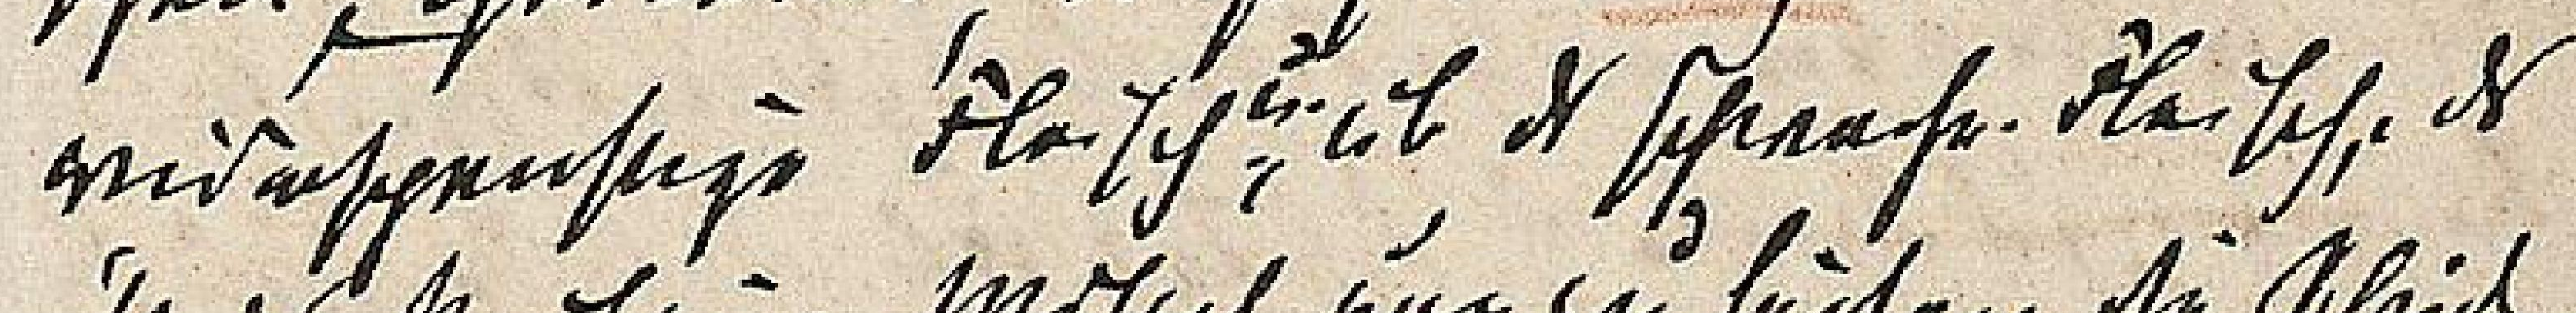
widerspennstige Fleisch u. üb. ds schwache Fleisch, das
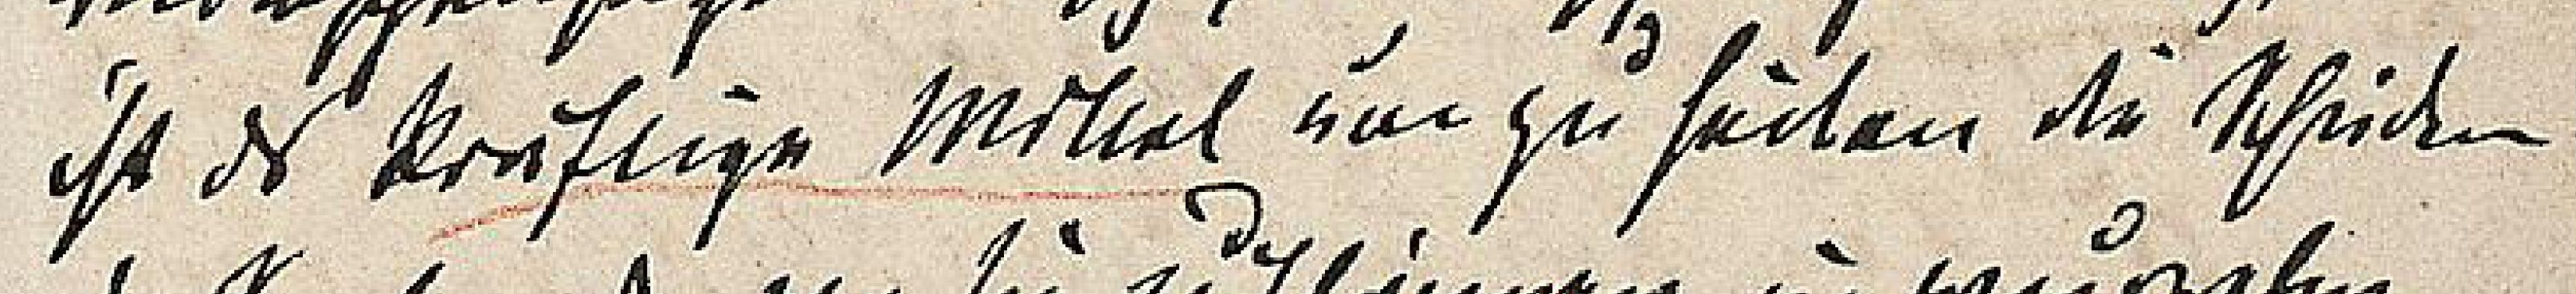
ist ds kräftige Mittel, um zu heilen die Schäden
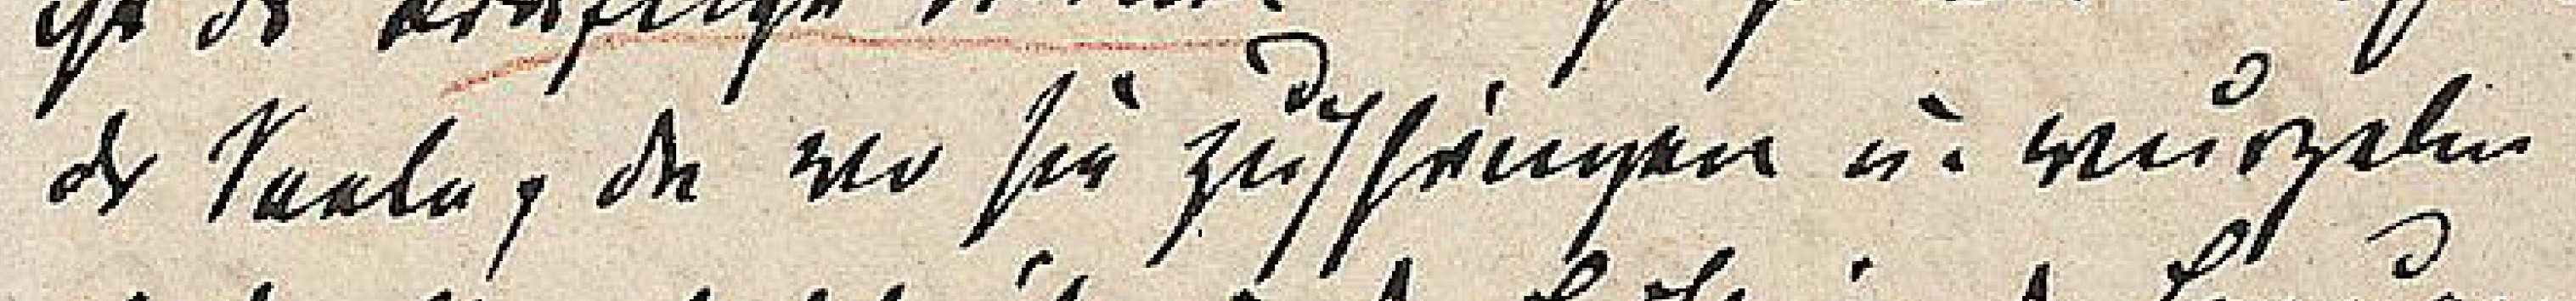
der Seele, da wo sie zushängen u. wurzeln
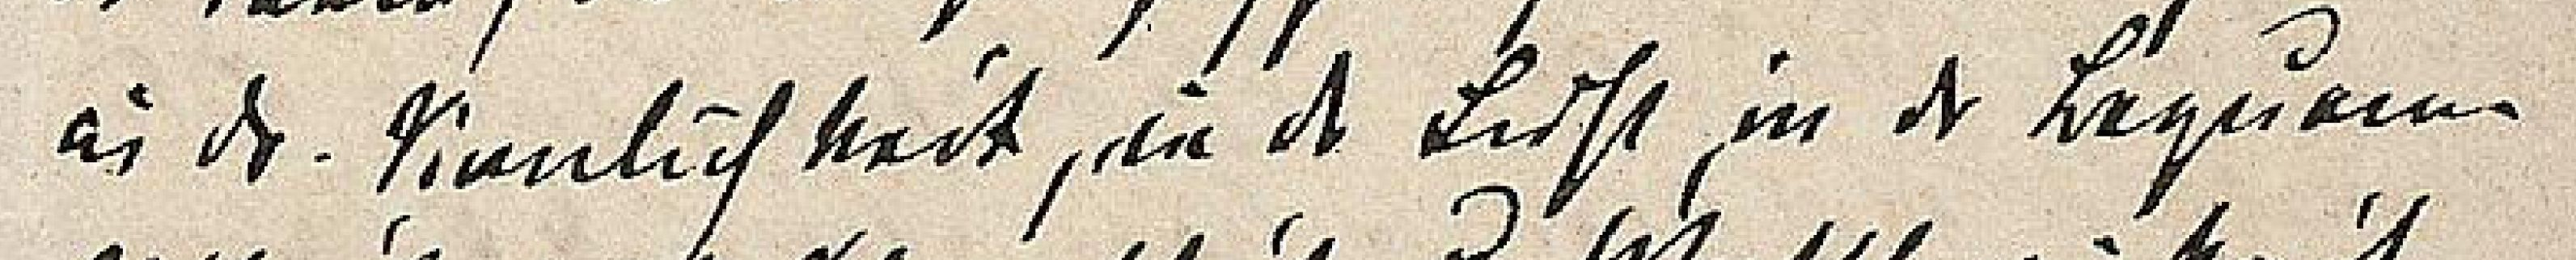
in dr. Sinnlichkeit, in der Lust, in dr Bequem¬
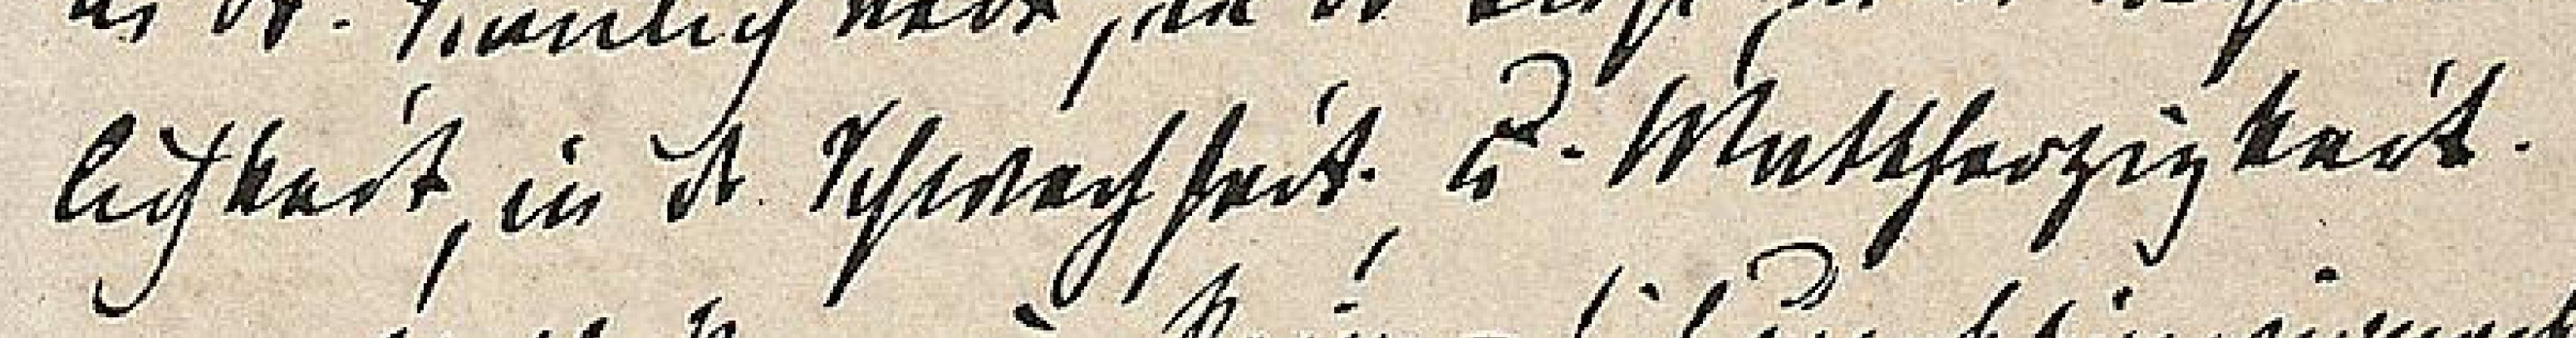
lichkeit, in dr. Schwachheit u. Mattherzigkeit.
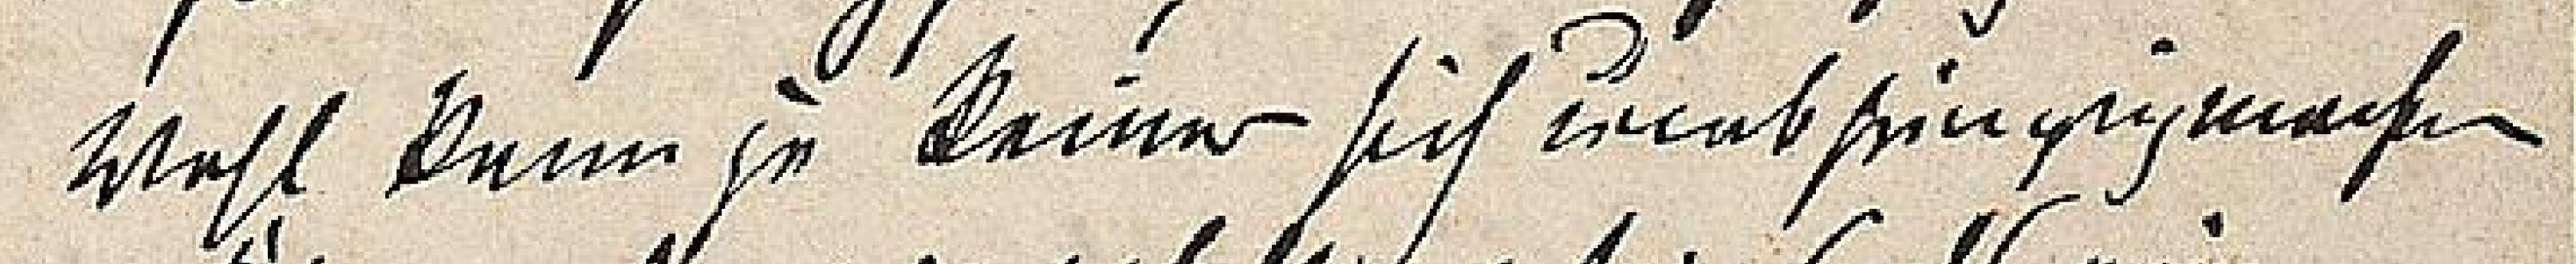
Wohl kann ja keiner sich unabhängigmachen
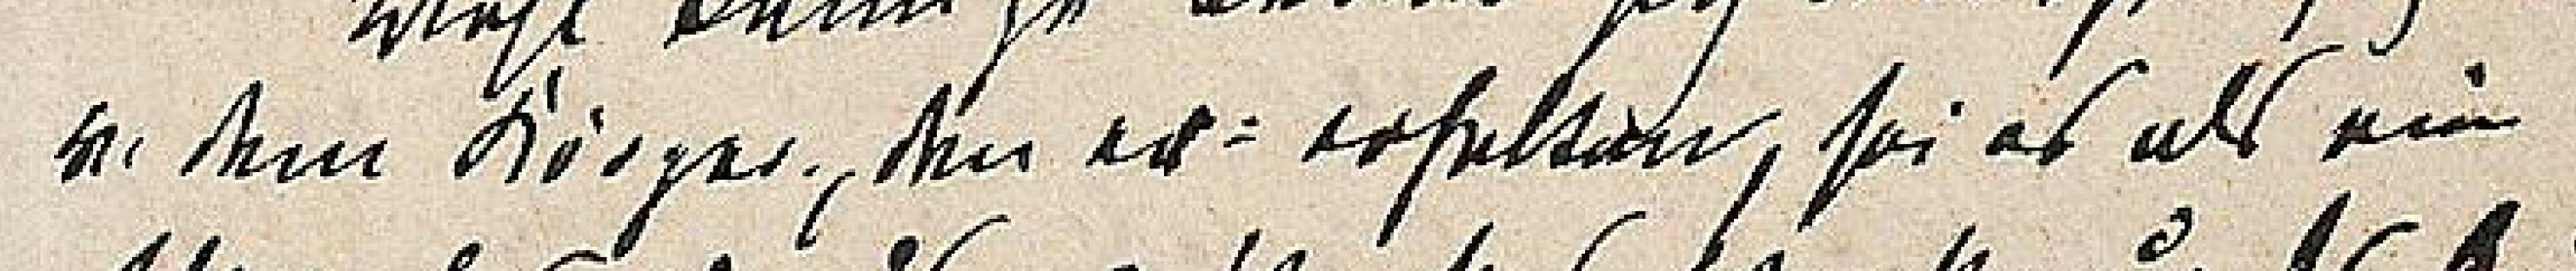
v. dem Körper., den er erhalten, sei es als ein
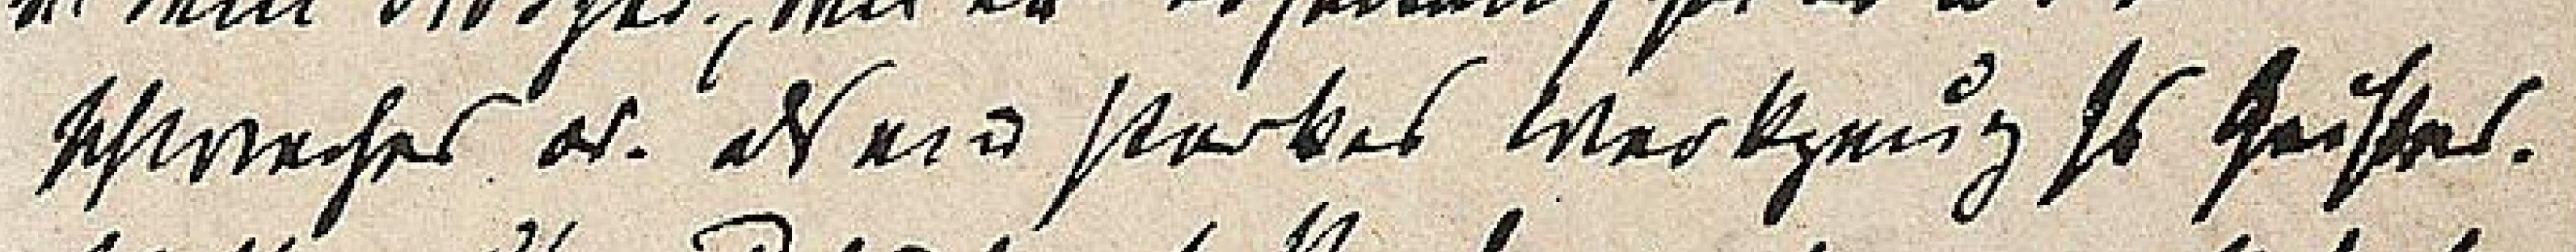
schwaches ob. als ein starkes Werkzeug ss Geistes.
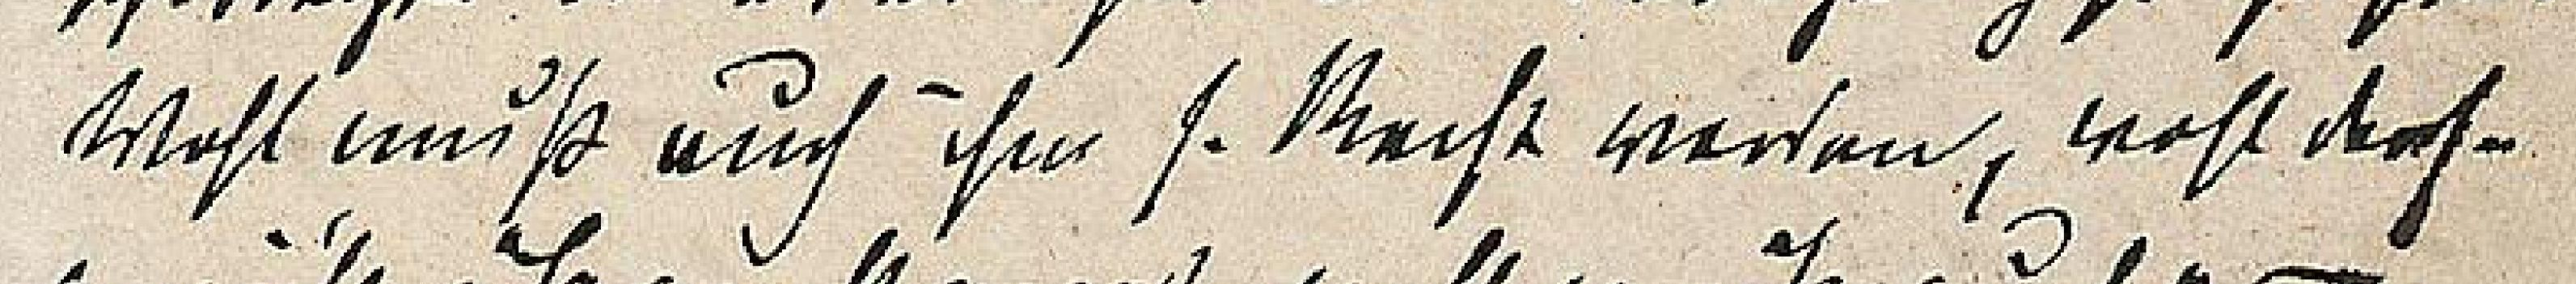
Wohl muß auch ihm s. Recht werden, wohl darf
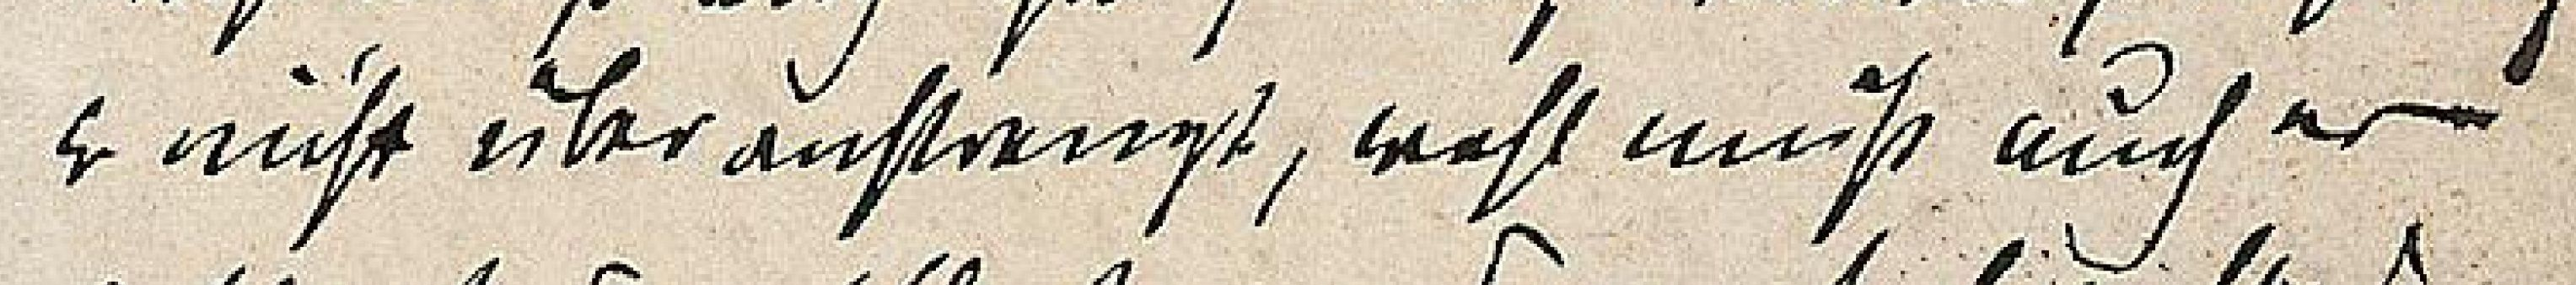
er nicht überanstrenge, wohl mußt auch er
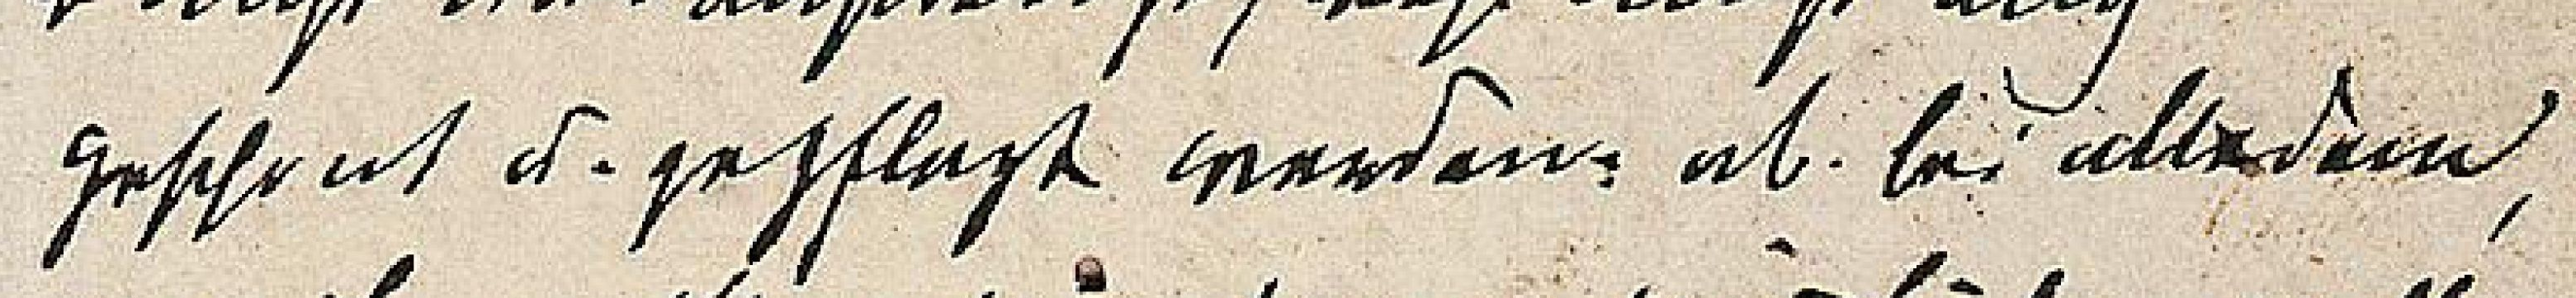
geschont d. gepflegt werden ab. bei alledem,
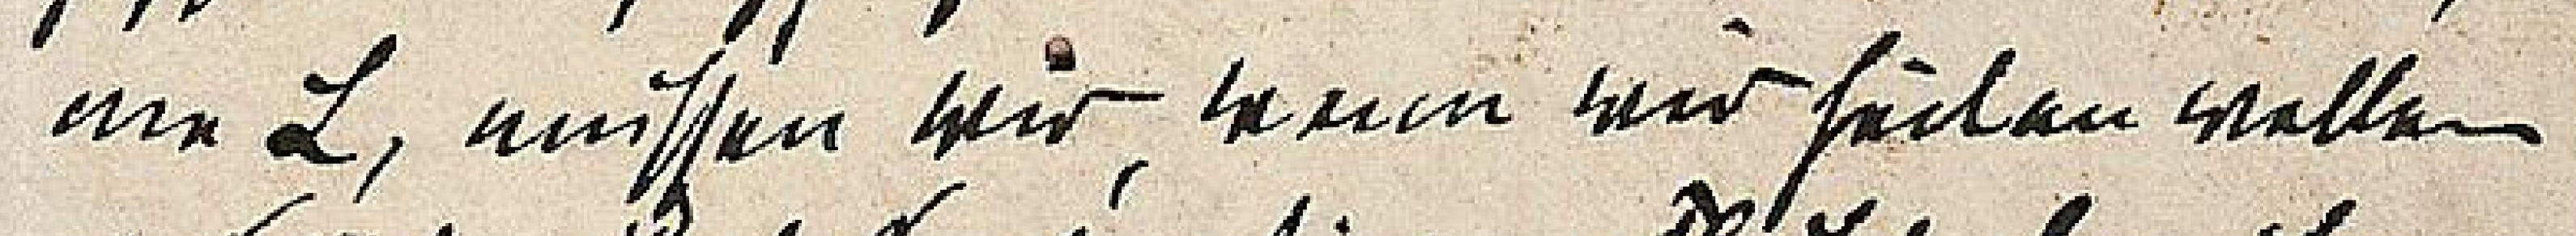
mn L., müssen wir, wenn wir heilen wollen
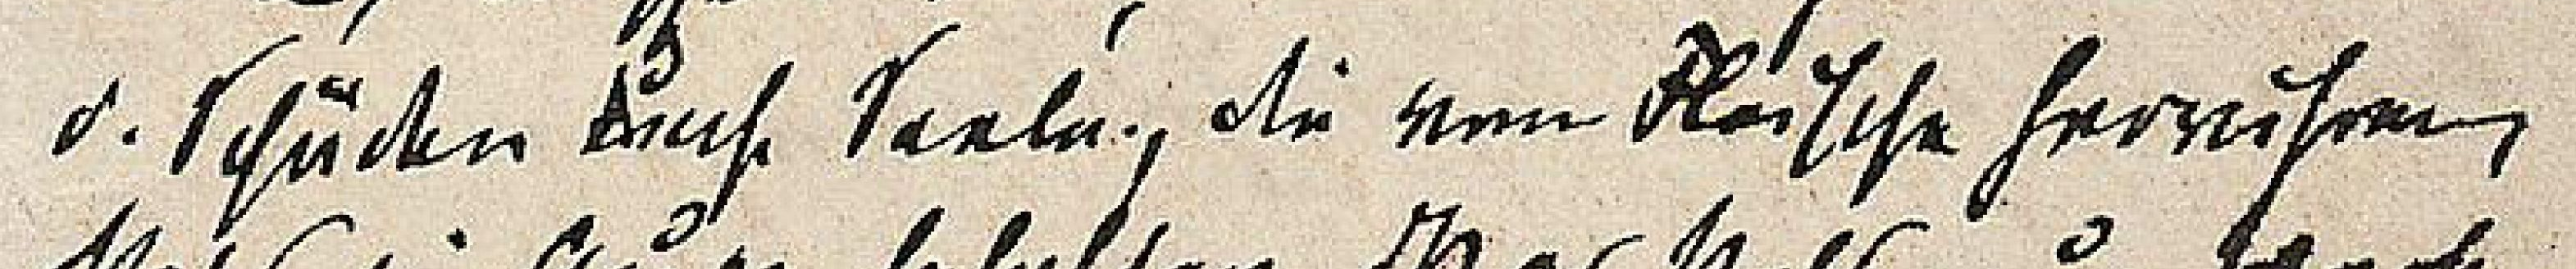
d. Schäden unsr Seele, die vom Fleische herrühren,
